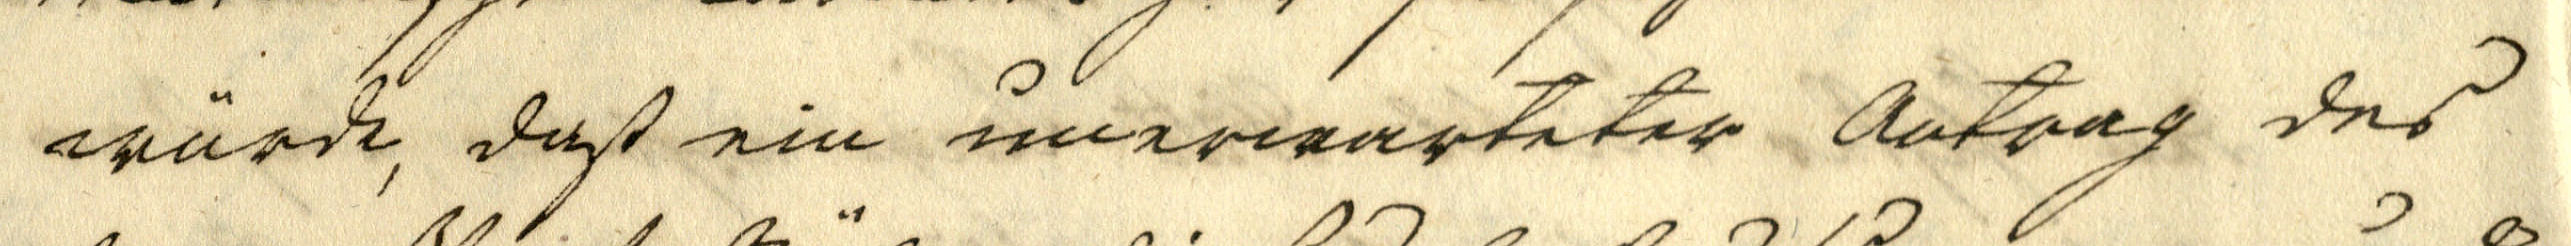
würde, daß ein unerwarteter Antrag des
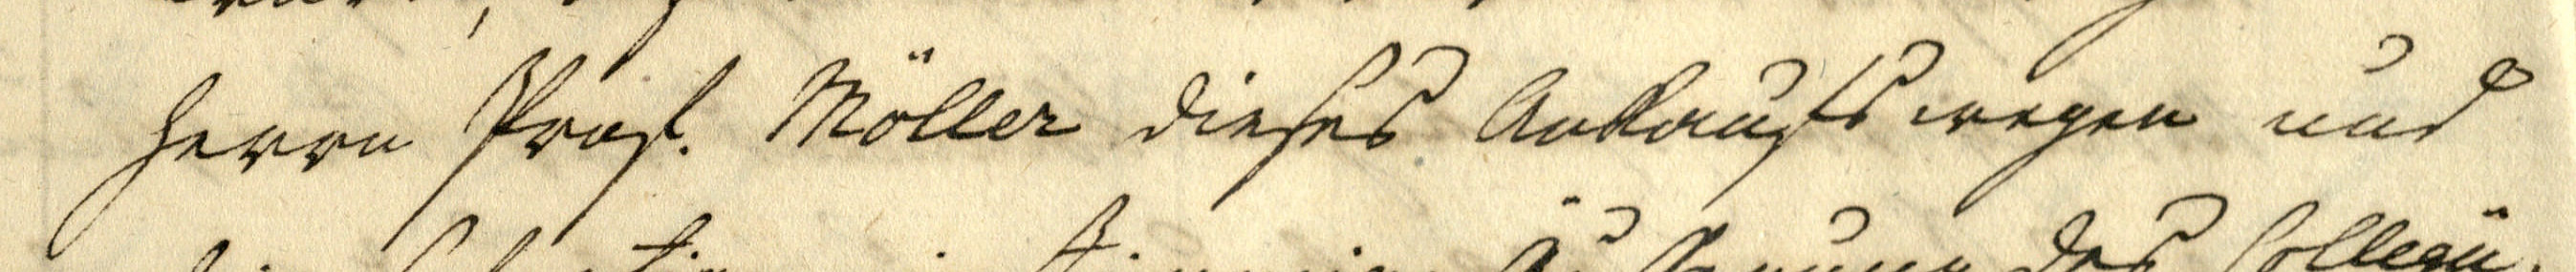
Herrn Prof. Möller dieses Ankaufs wegen und
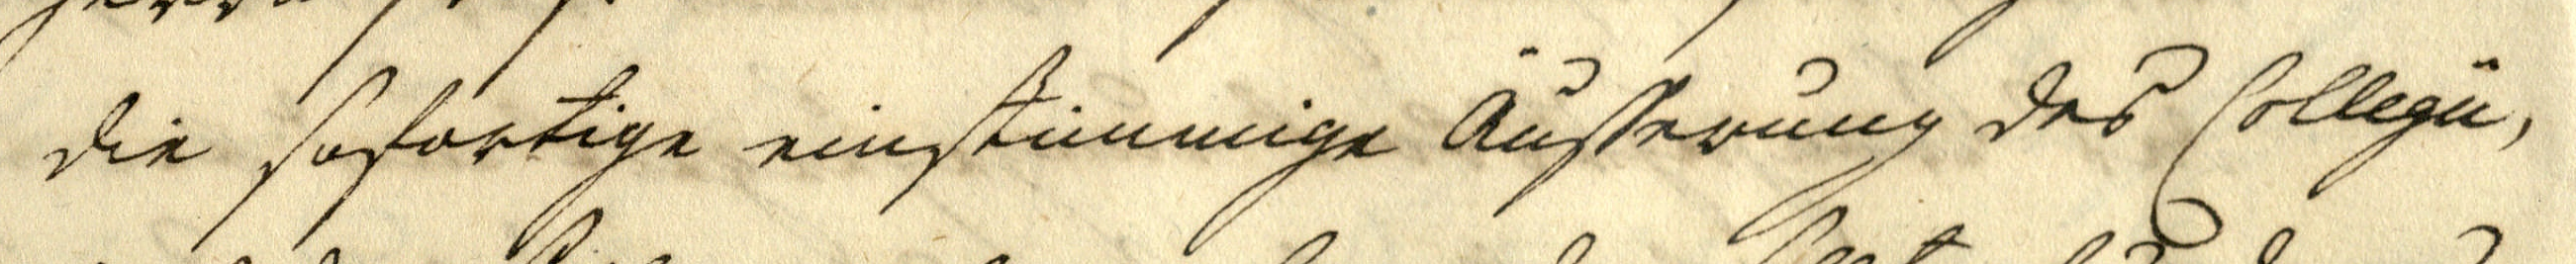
die sofortige einstimmige Äusserung des Collegii,
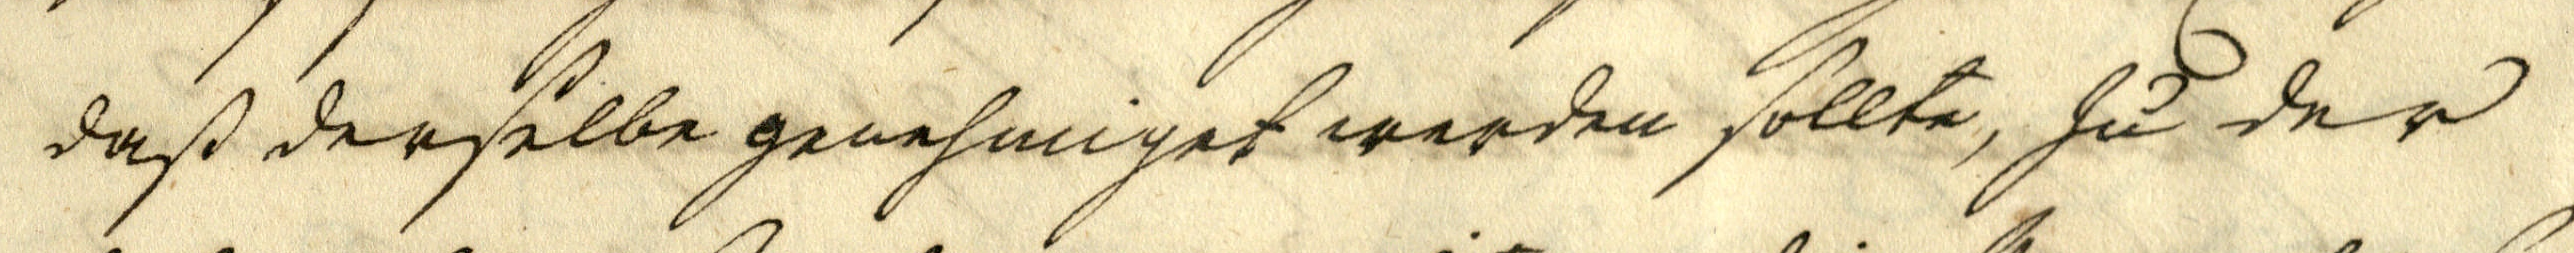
daß derselbe genehmiget werden sollte, zu der
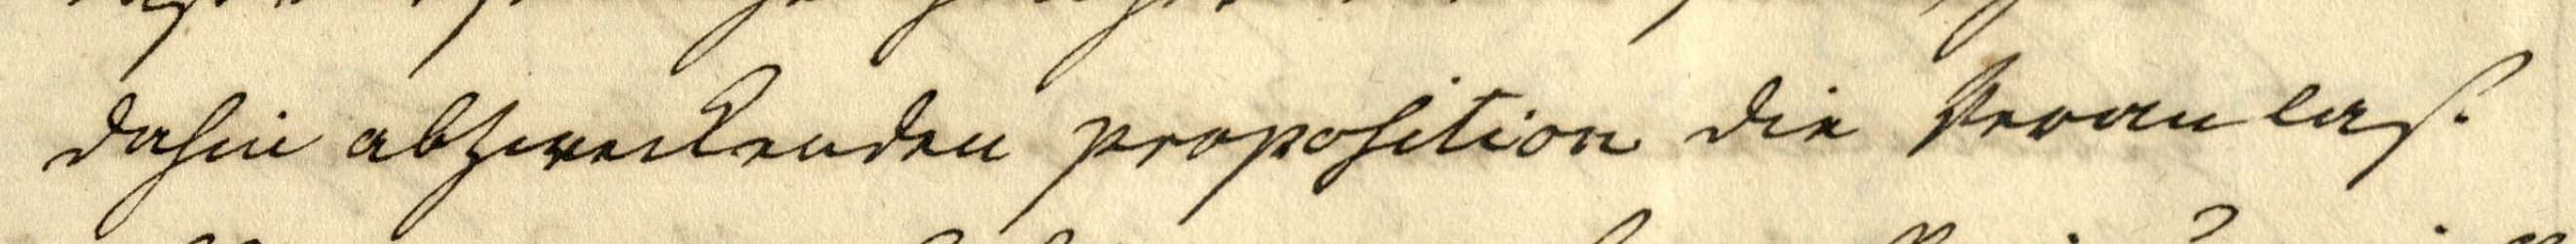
dahin abzweckenden proposition die Veranlas-
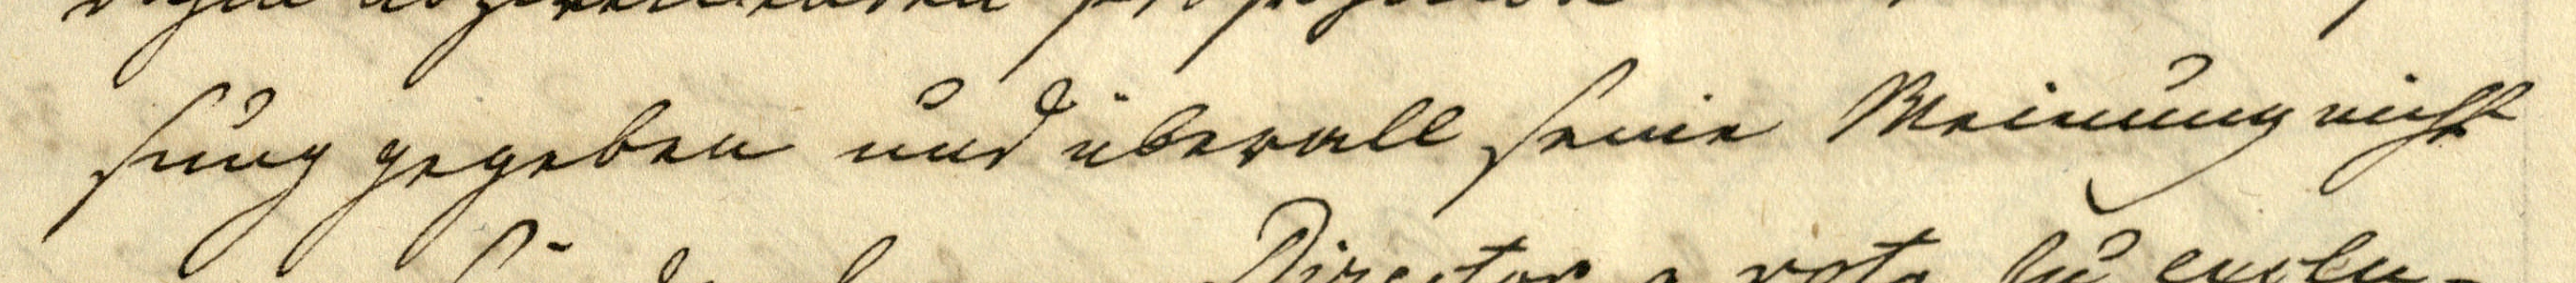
sung gegeben und überall seine Meiung nicht
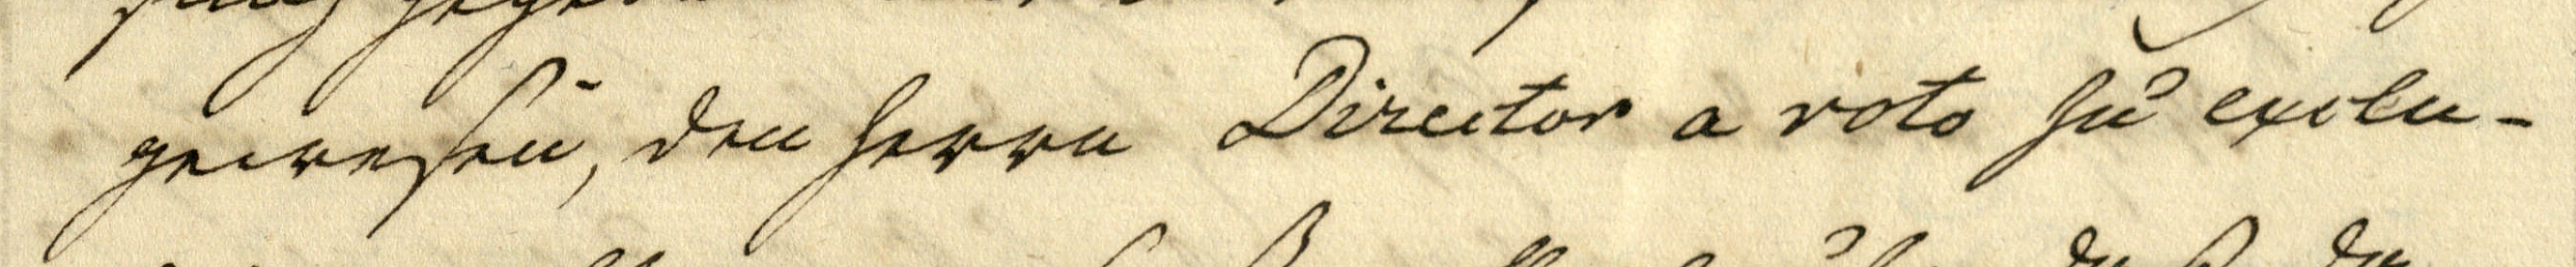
gewesen, den Herrn Director a voto zu exclu-
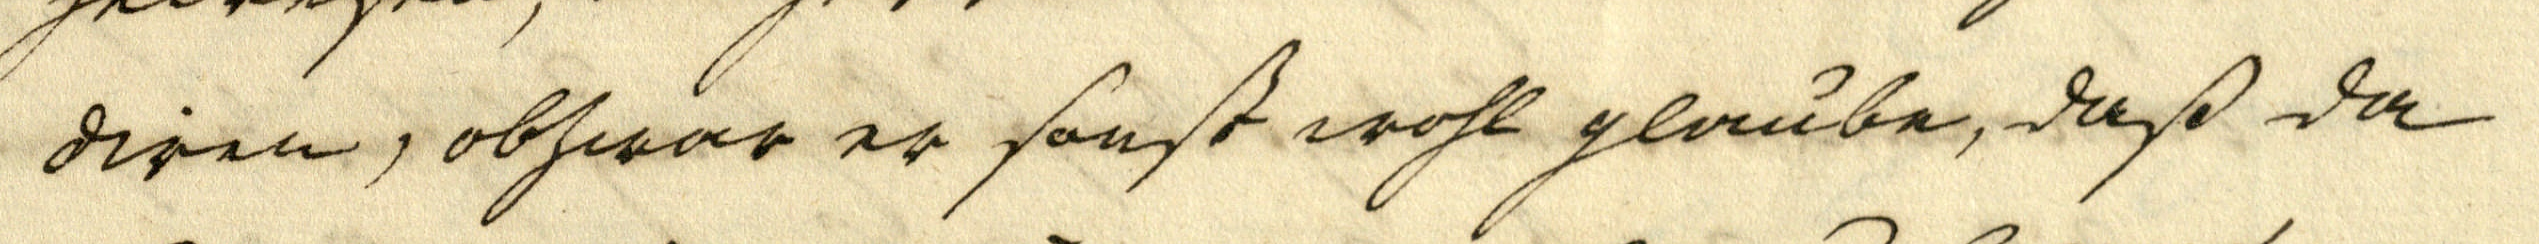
diren, obzwar er sonst wohl glaube, daß da
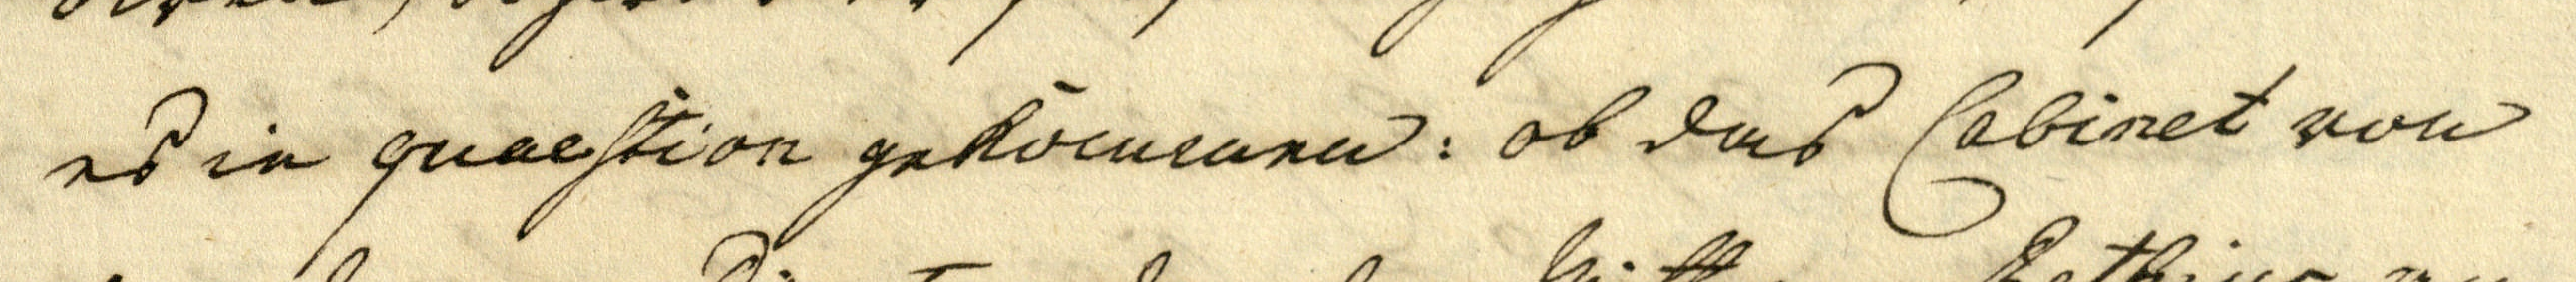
es in quaestion gekommen: ob das Cabinet von
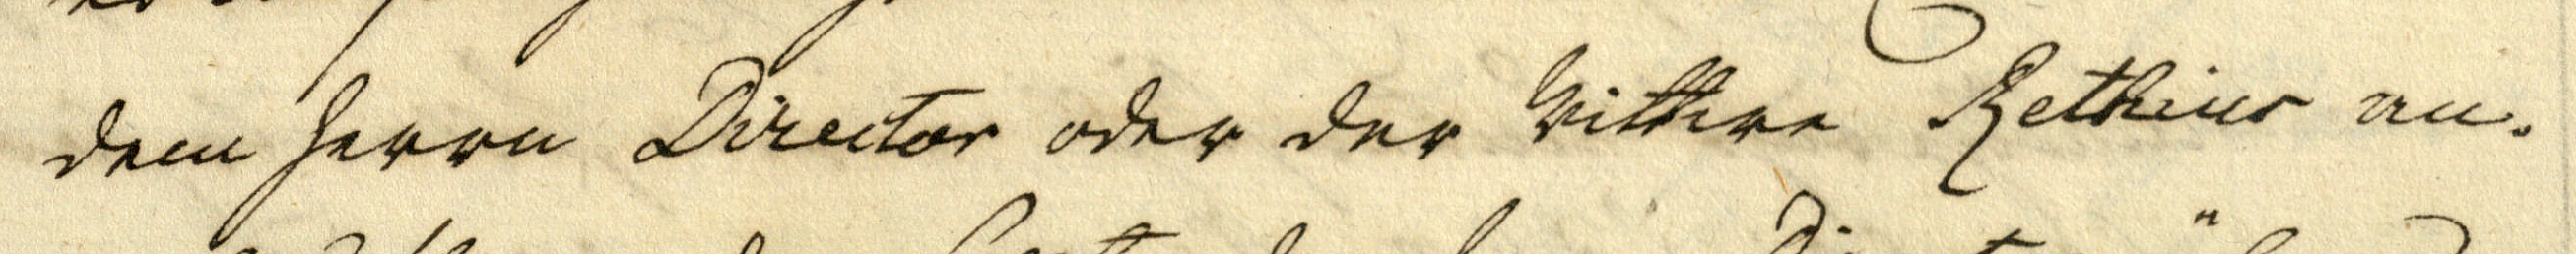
dem Herrn Director oder der Wittwe Rethius an-
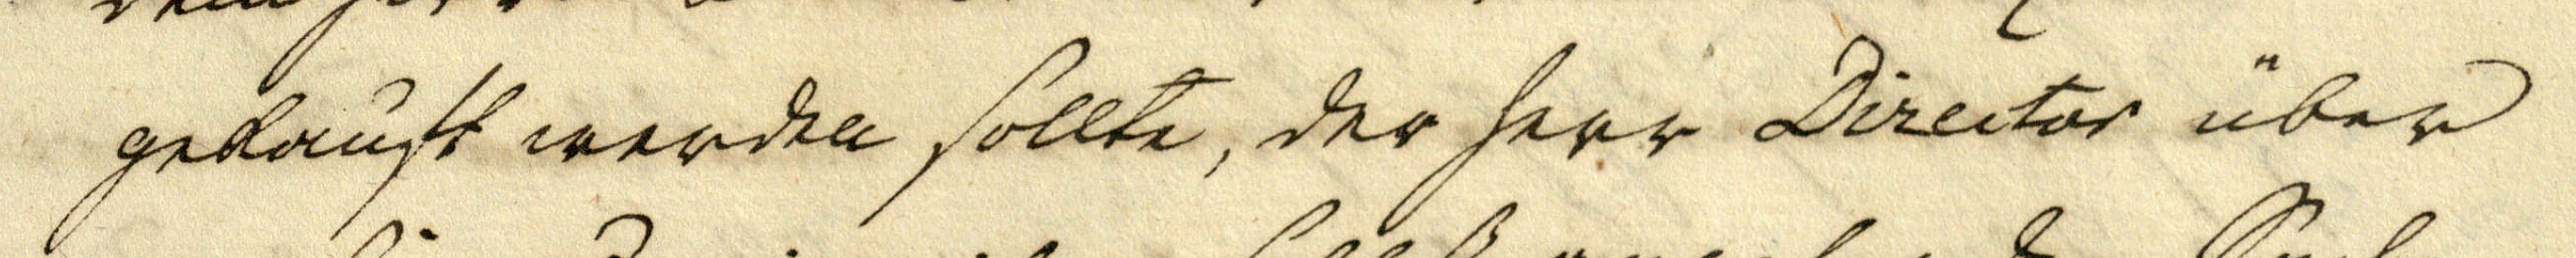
gekauft werden sollte, der Herr Director über
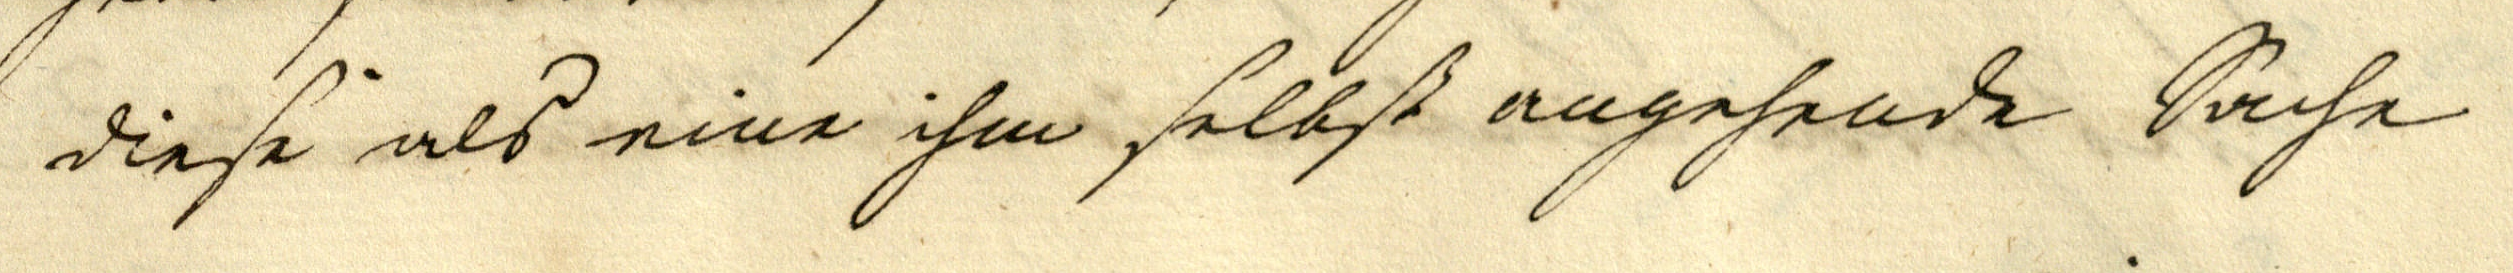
diese als eine ihm selbst angehende Sache
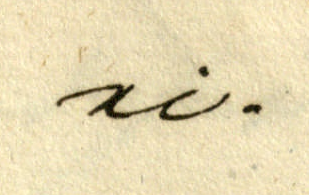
ei-
